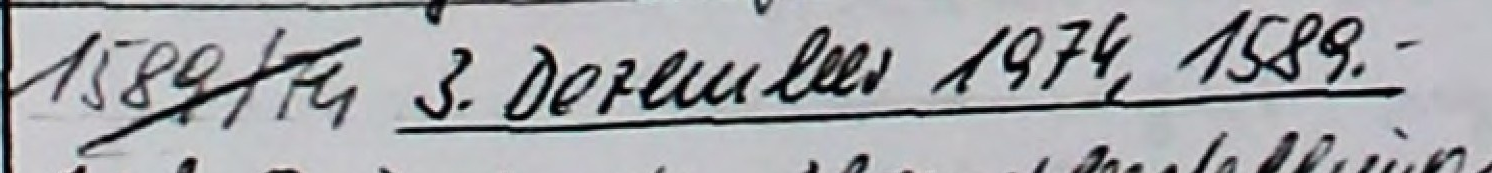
1589/74 3. Dezember 1974, 1589.-
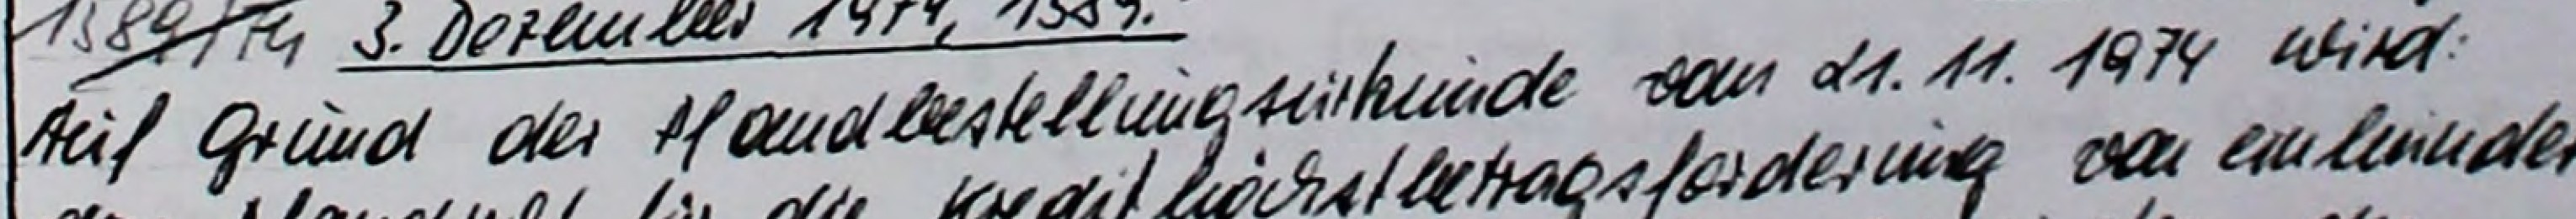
Auf Grund der Pfandbestellungsurkunde von 21.11.1974 wird:
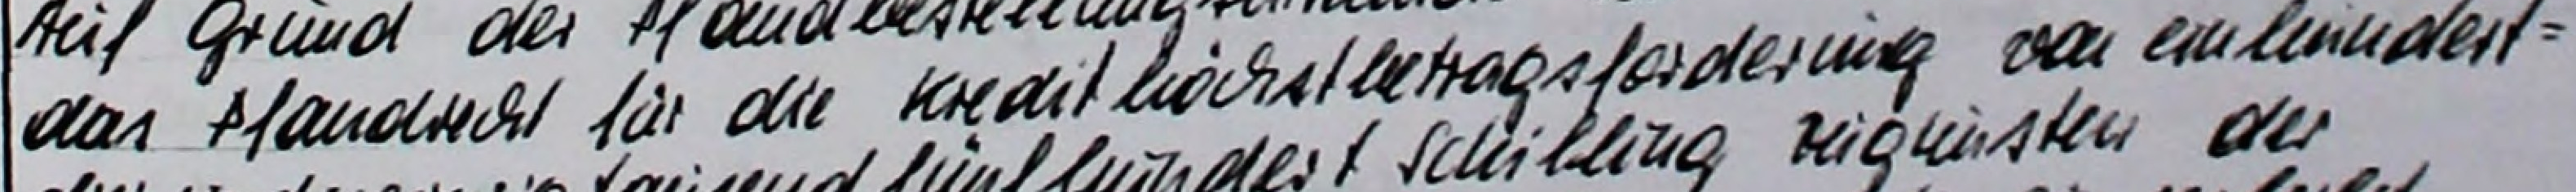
das Pfandrecht für die Kredithöchstbetragsforderung von ein hundert=
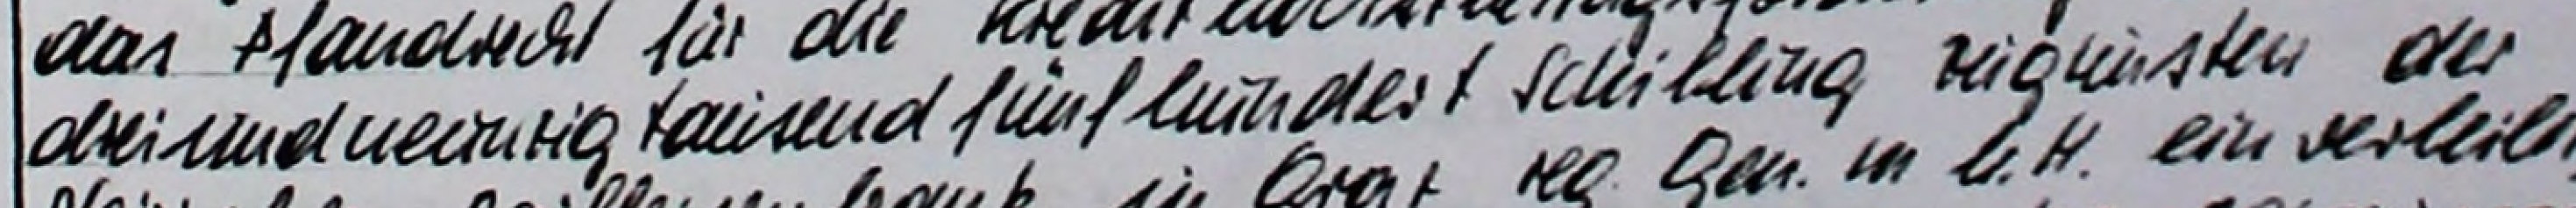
drei und neunzig tausend fünf hundert Schilling zugunsten der
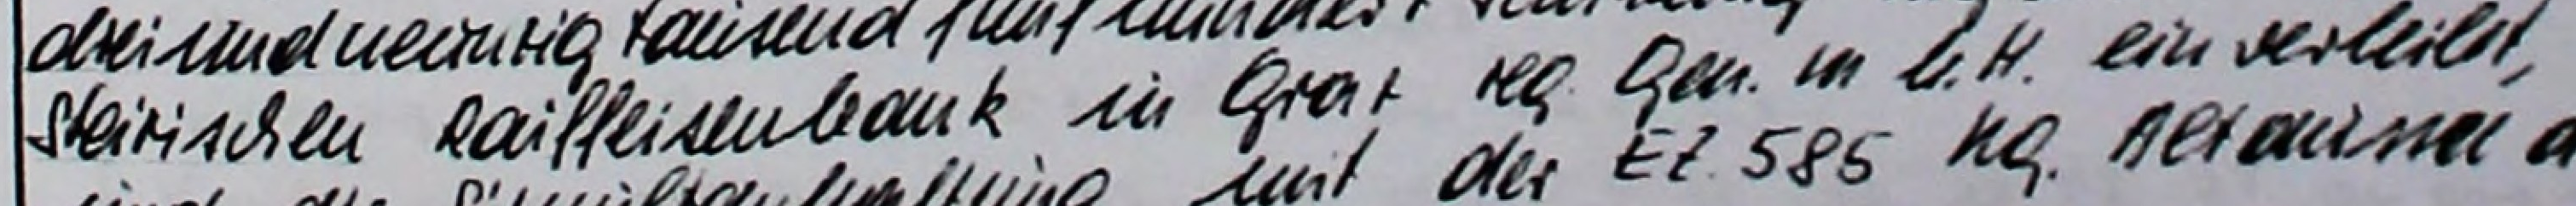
steirischen Raiffeisenbank in Grat reg. Gem. m. b. H. einverleibt,
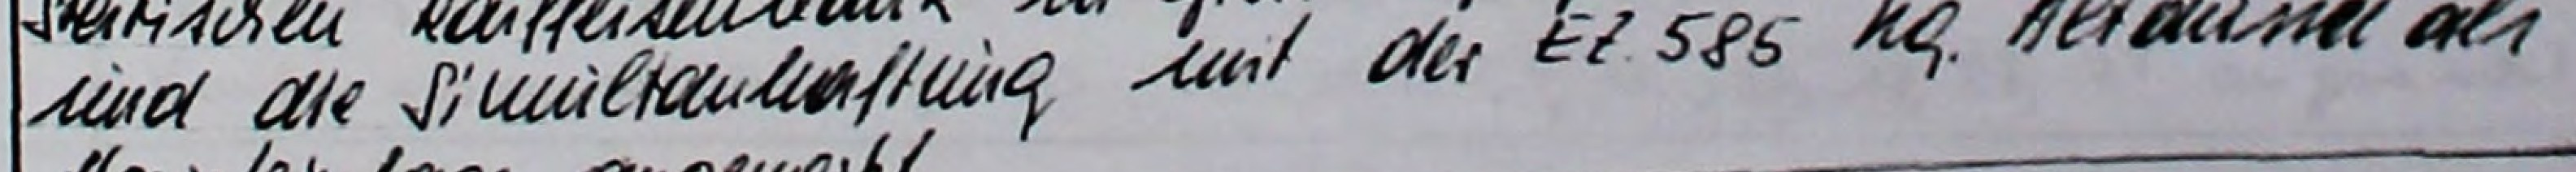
und die Simultanhaftung mit der EZ. 585 KG. Altaussee als
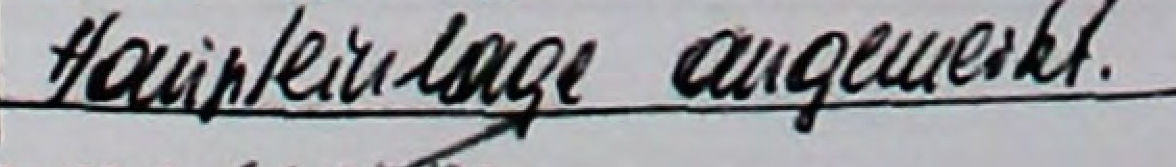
Haupteinlage angemerkt.
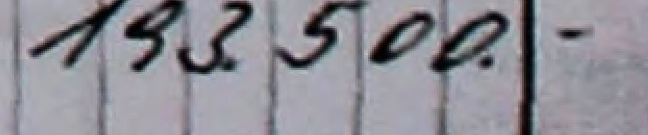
193.500.
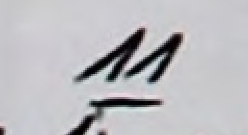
11
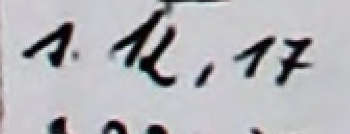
s. 12, 17
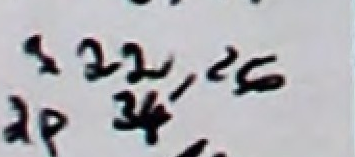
s 22, 26
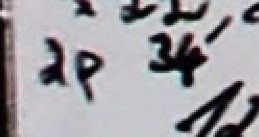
29 34
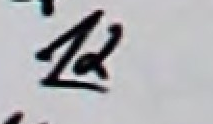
12
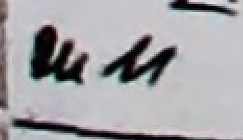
zu 11
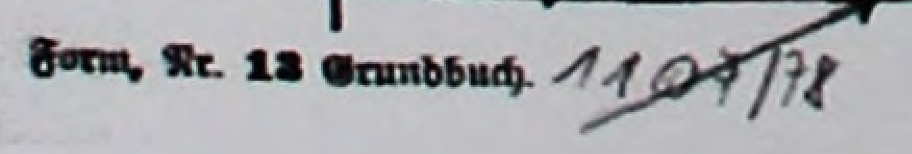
Form, Kr. 13 Grundbuch. 1107/78
